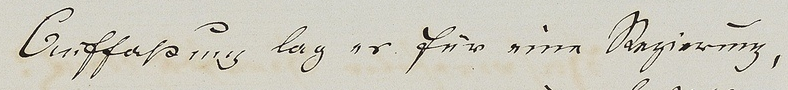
Auffaßung lag es für eine Regierung,
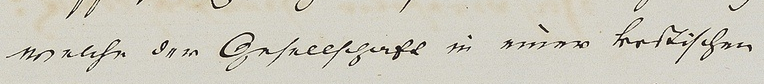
welche der Gesellschaft in einer kritischen
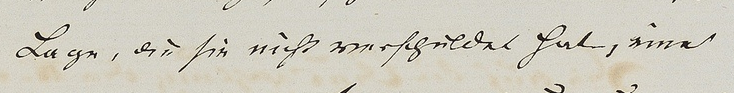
Lage, die sie nicht verschuldet hat, eine
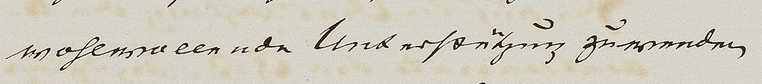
wohlwollende Unterstützung zuwenden
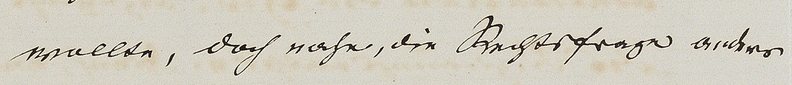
wollte, doch nahe, die Rechtsfrage anders
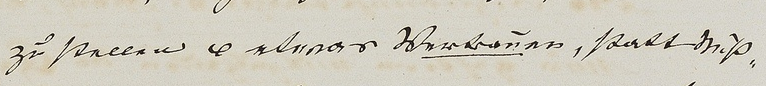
zu stellen & etwas Vertrauen, statt Miß-
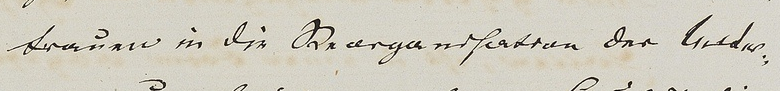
trauen in die Reorganisation der Unter-
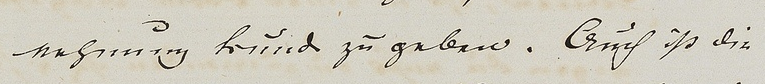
nehmung kund zu geben. Auch ist die
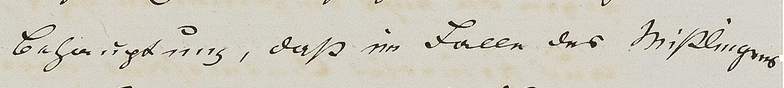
Behauptung, daß im Falle des Mißlingens
